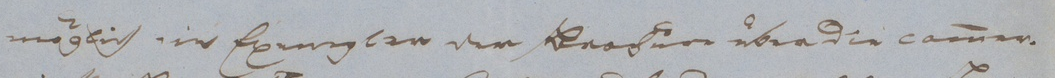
möglich ein Exemplar der Brochüre über die commer-
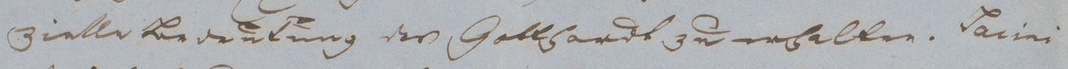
zielle Bedeutung des Gotthardt zu erhalten. Jacini
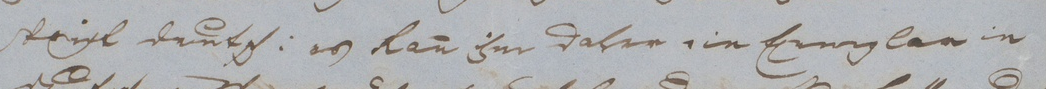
spricht deutsch: es kann ihm daher ein Exemplar in
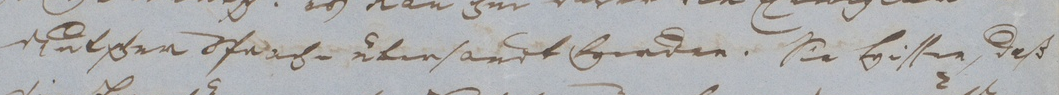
deutscher Sprache übersandt werden. Sie wissen, daß
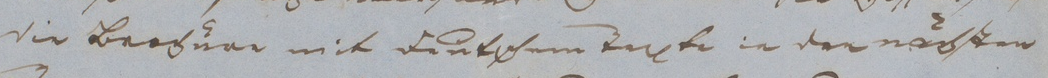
die Brochüre mit deutschem Texte in den nächsten
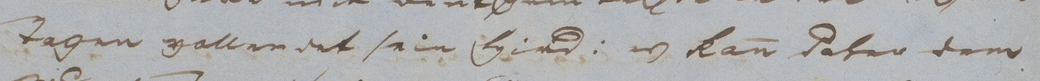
Tagen vollendet sein wird: es kann daher dem
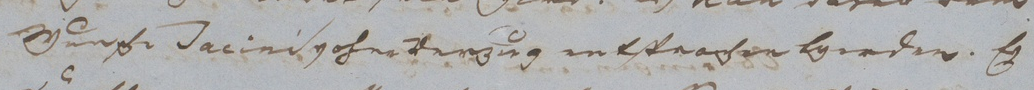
Wunsche Jacini's ohne Verzug entsprochen werden. Es
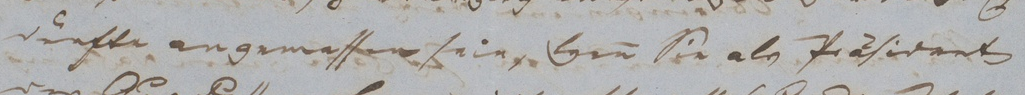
dürfte angemessen sein, wenn Sie als Präsident
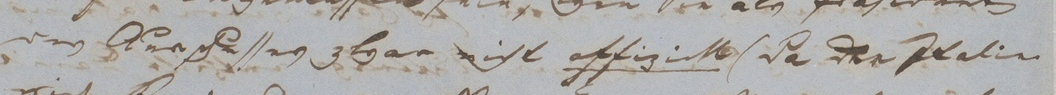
des Ausschusses zwar nicht offiziell (da der Italie-
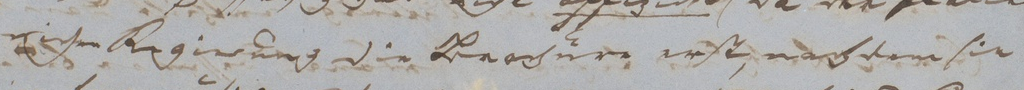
nischen Regierung die Brochüre erst, nachdem sie
